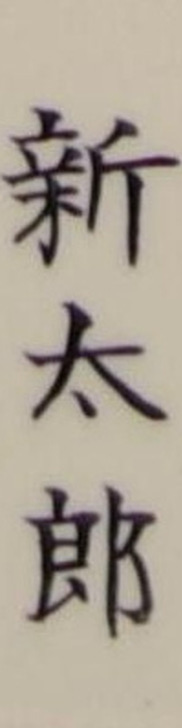新太郎
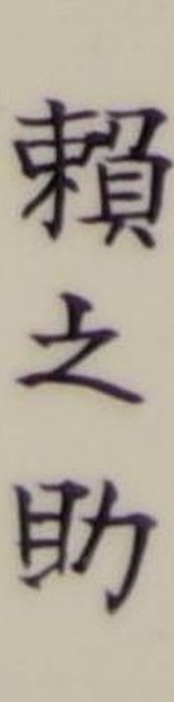頼之助
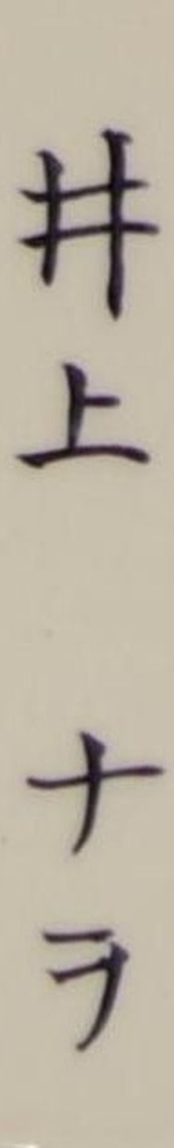井上ナヲ
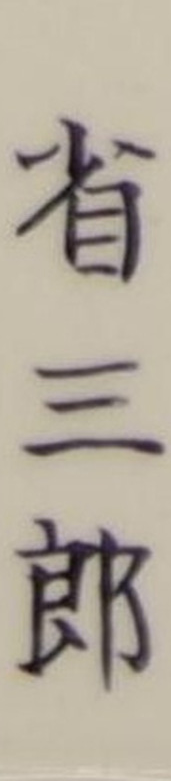省三郎

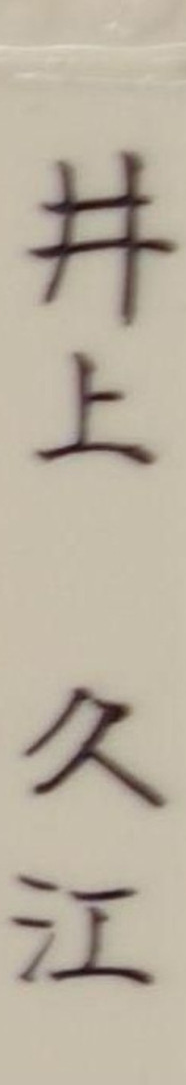井上久江
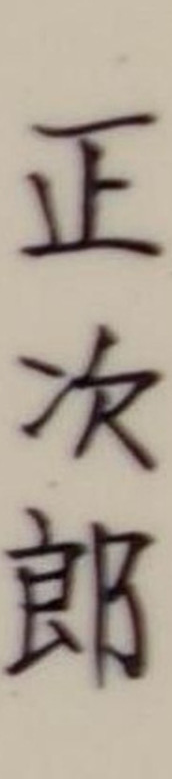正次郎
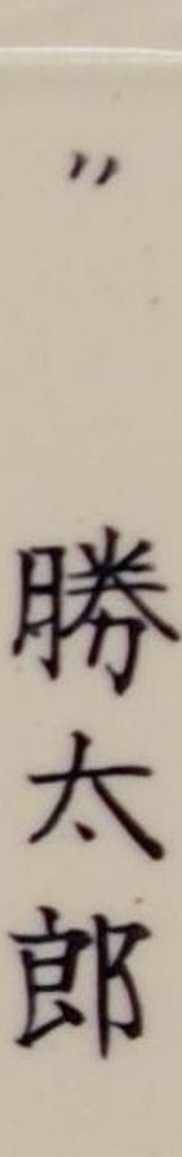勝太郎
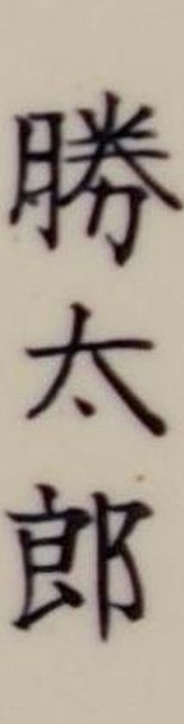勝太郎
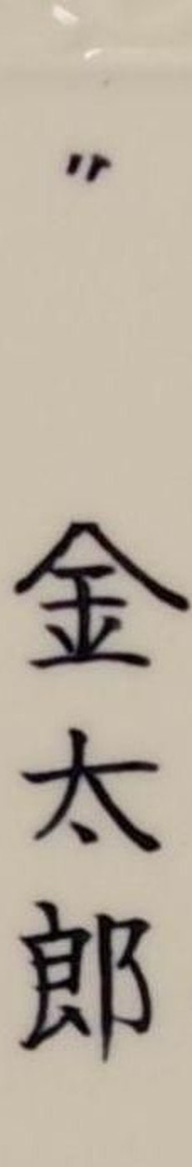金太郎
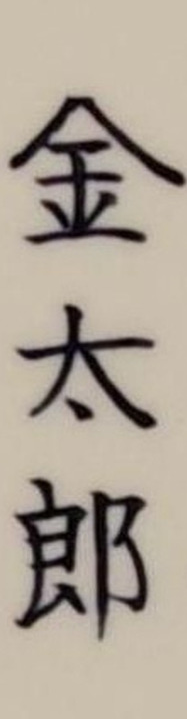金太郎
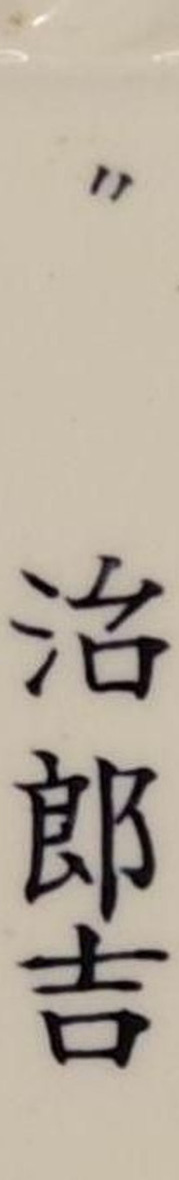治郎吉
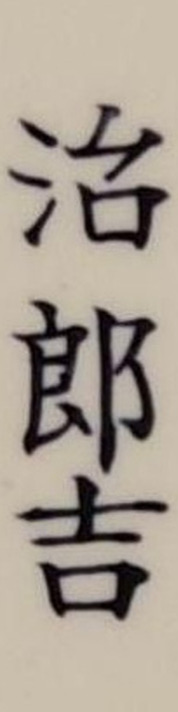治郎吉
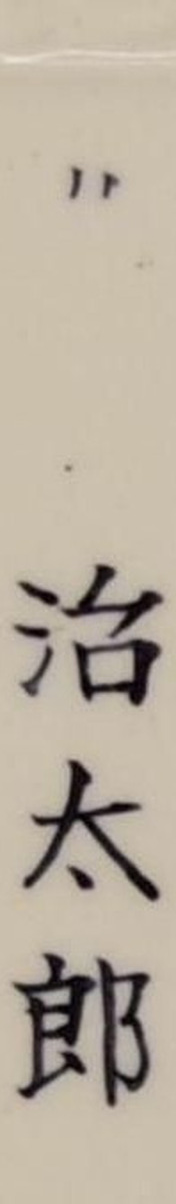治太郎
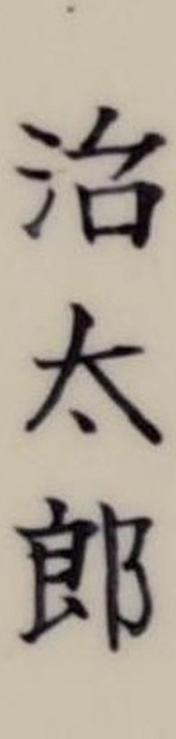治太郎
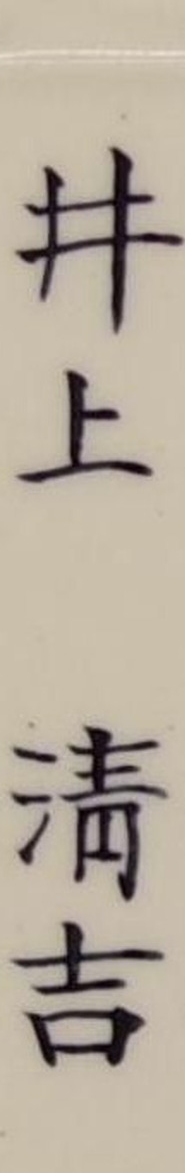井上清吉
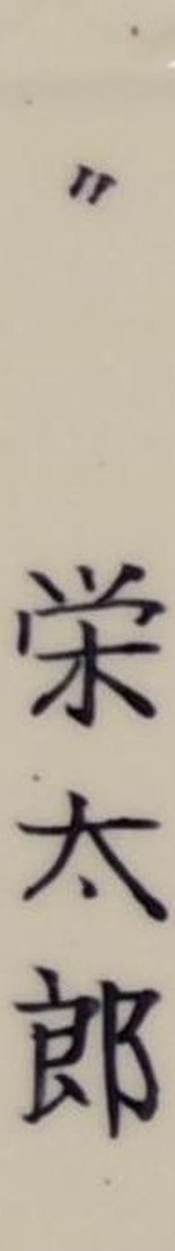栄太郎
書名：M~S
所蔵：高野山金剛峯寺
